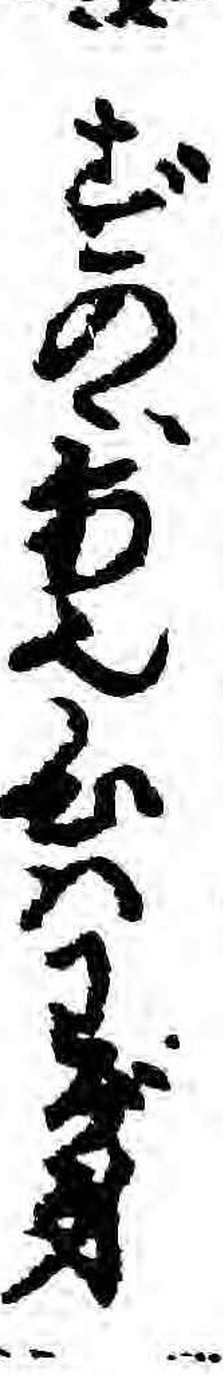ずの哥也心はわが身
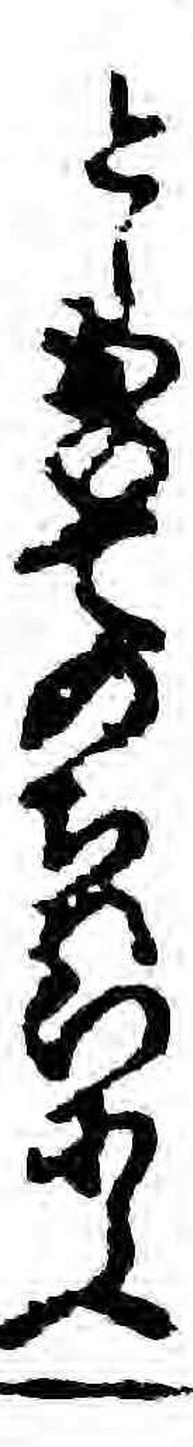としおいてのちはいにしへ
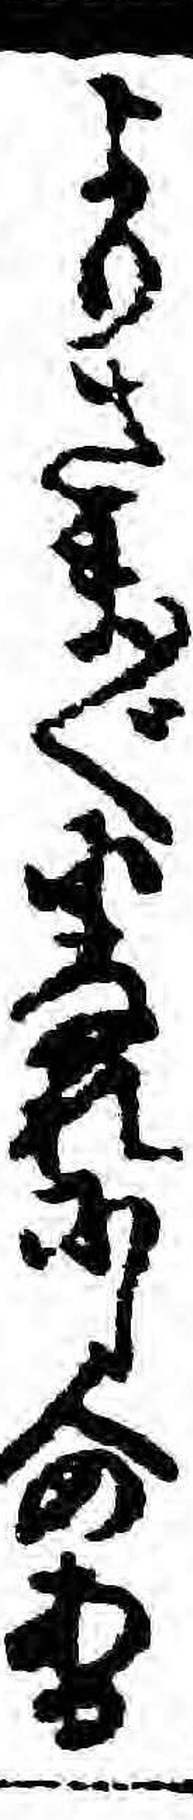よりさま〴〵になれにし人のある
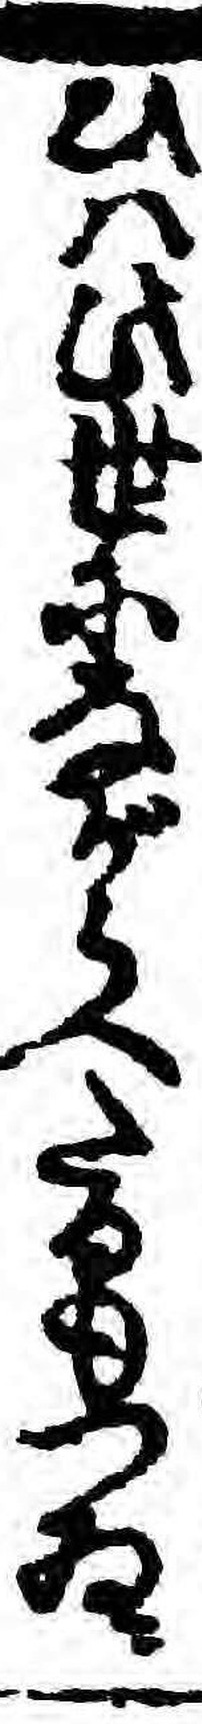ひは此世にながらへたるもつゐ
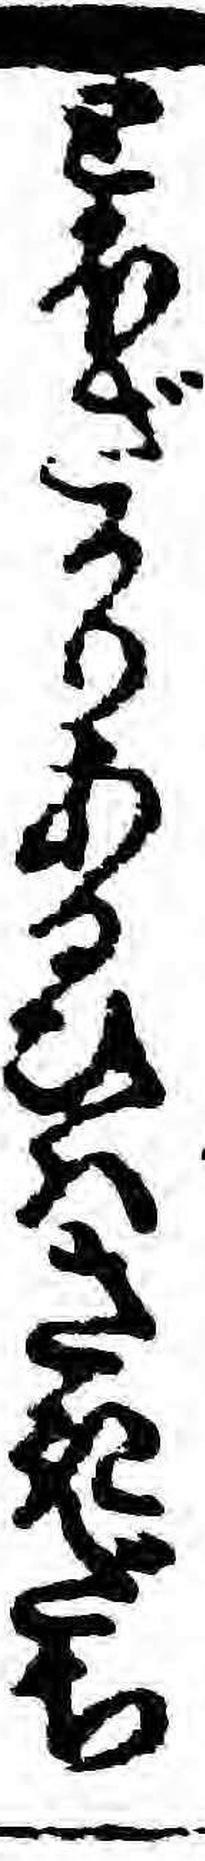とほざかりあるひはさきだち
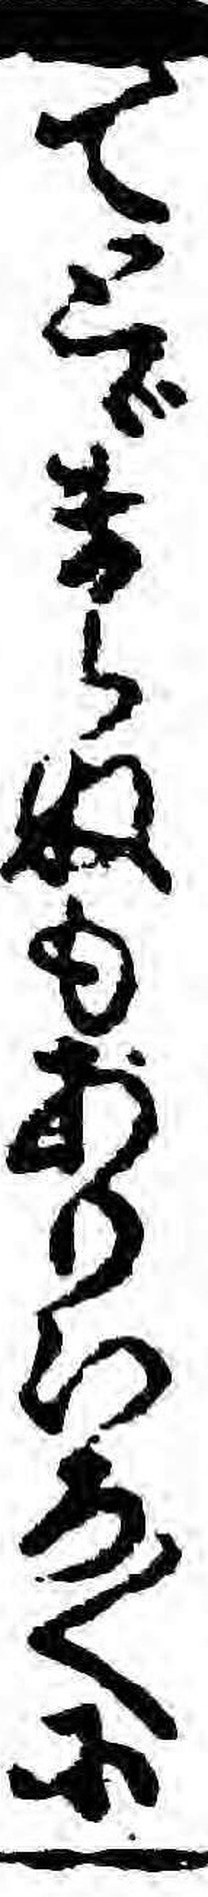てとゞまらぬもありいろ〳〵に
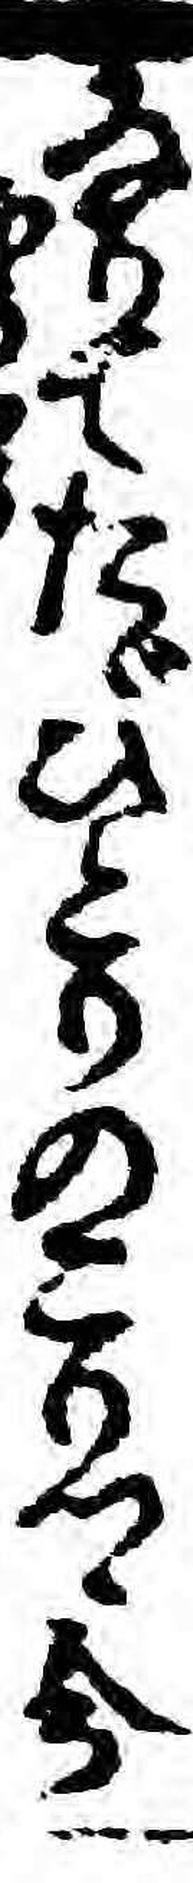なりてたゞひとりのこりて今
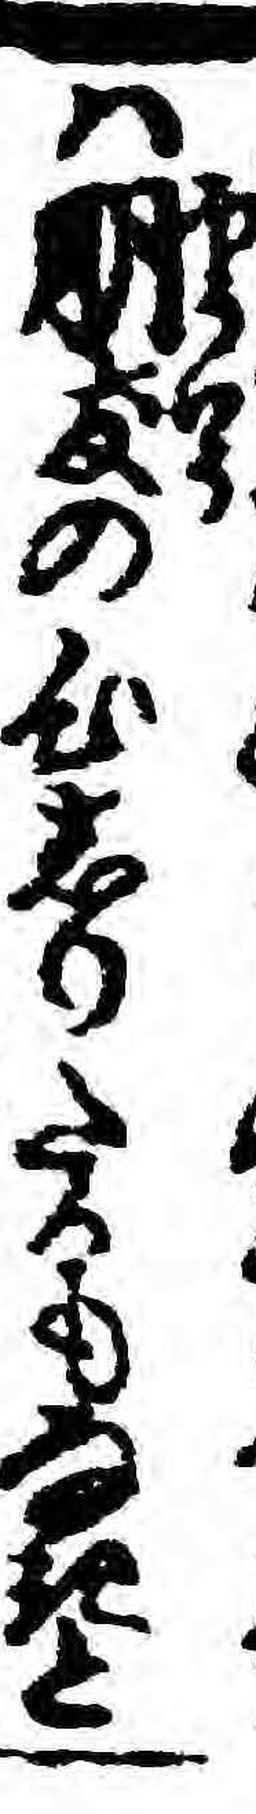は朋友の心しりたるもなきと
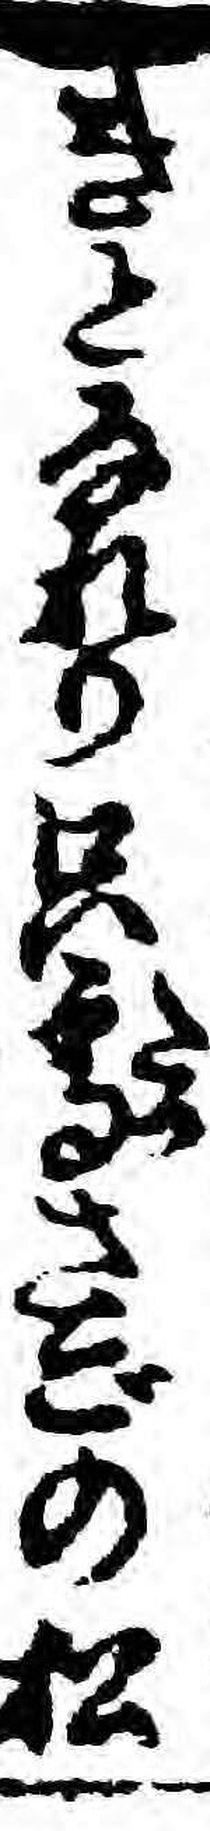きとなれり只高さごの松
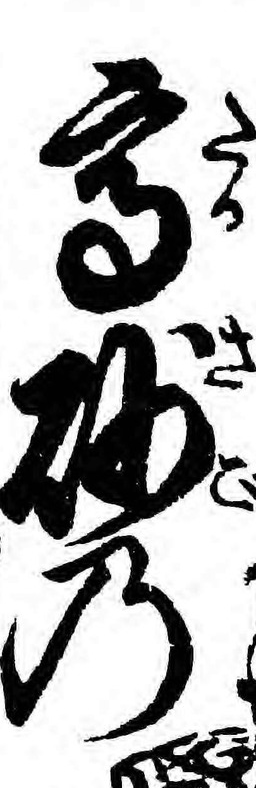高砂の
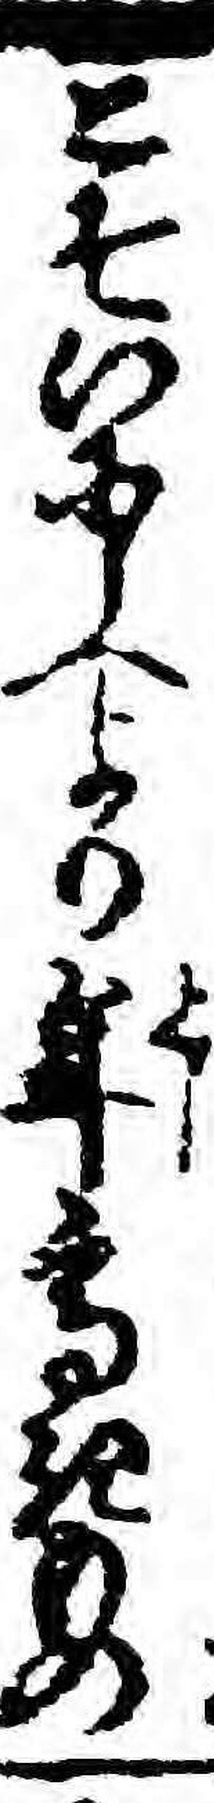こそいにしへより年尊きもの
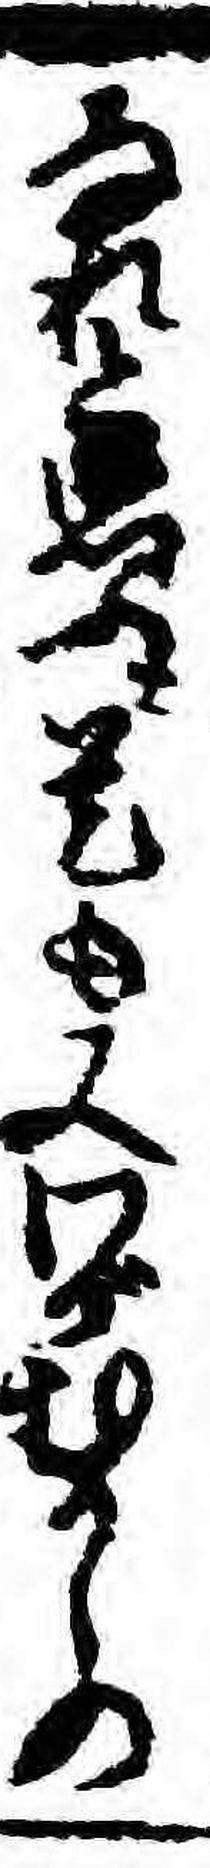なれと思ふに是も又わがむかしの
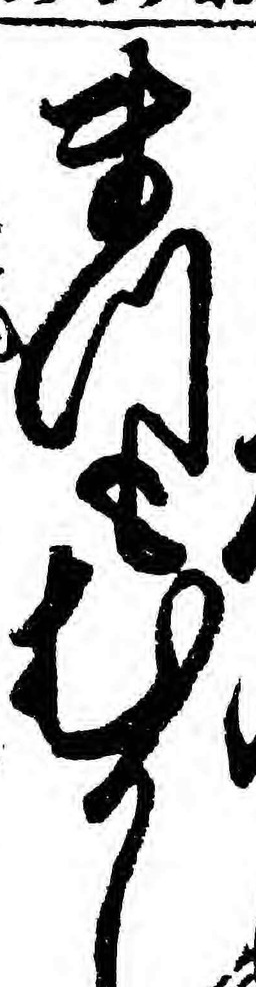まつもむかしの
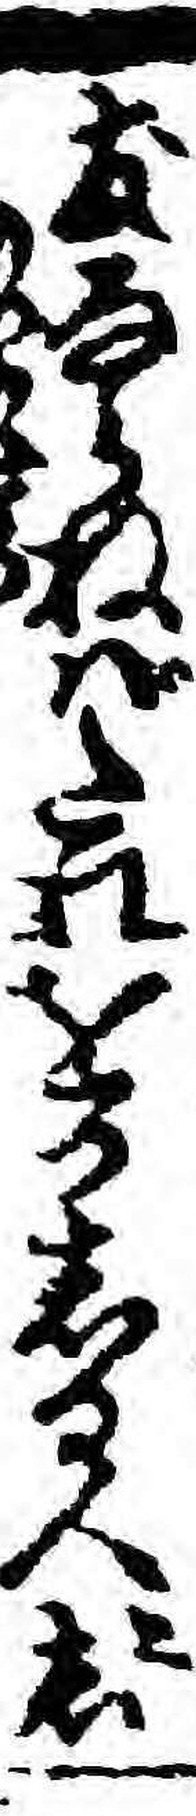友ならねばたれをかしる人にし
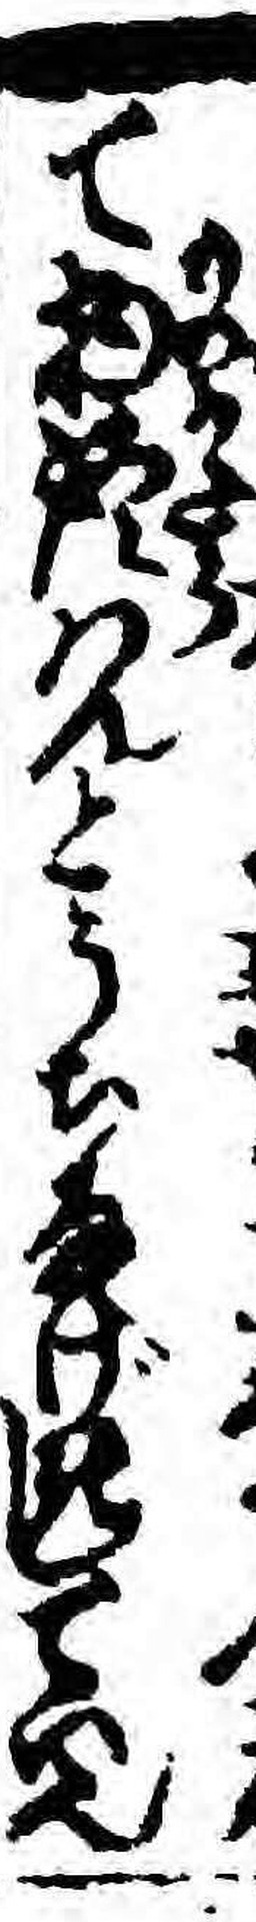て物語けんとうちなげきしてい也
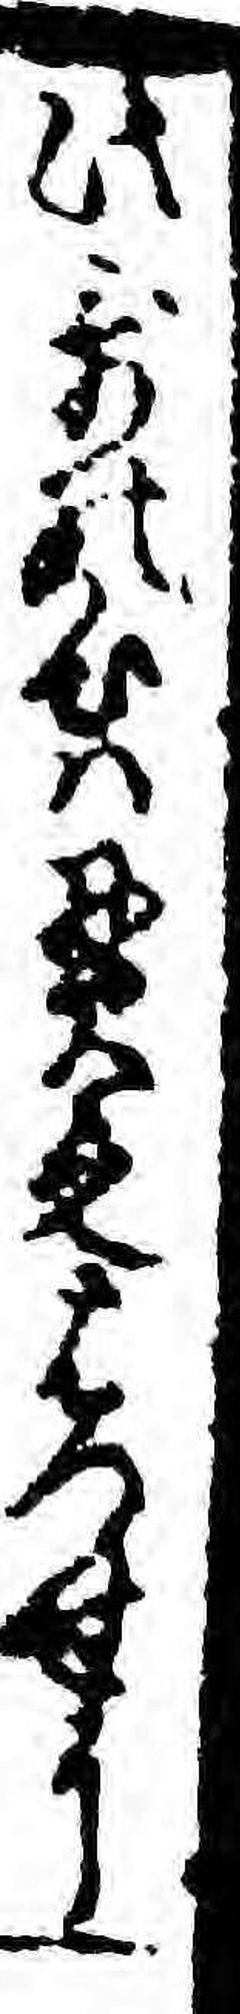此哥の心は貫之はつせに
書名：頭書和歌注譯／壽賀多百人一首小倉錦
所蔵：国文学研究資料館
